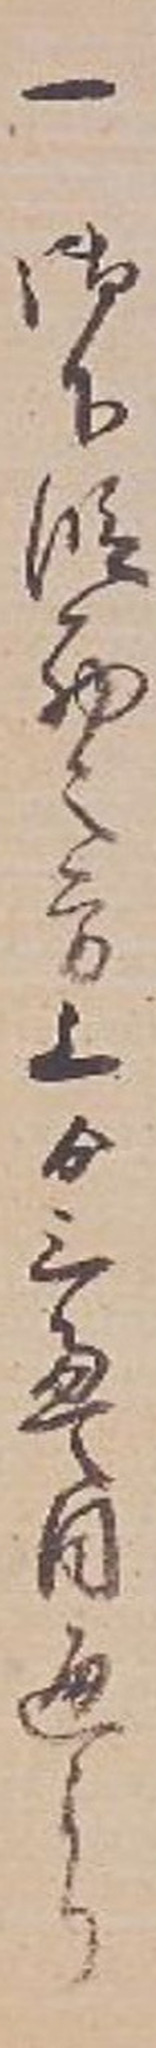一御下段西之方上ゟ三畳目通より
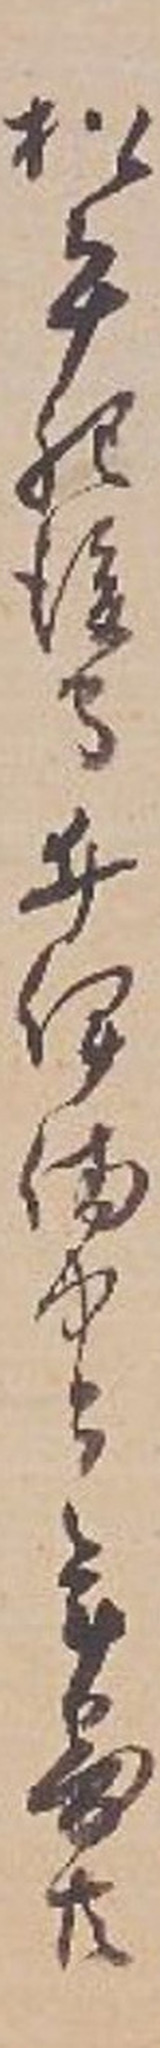松平肥後守井伊備中守年寄共
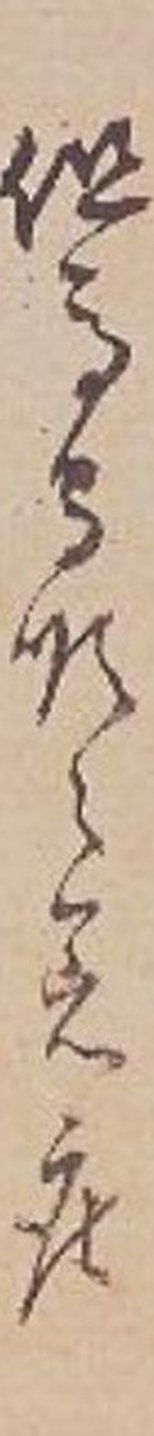但馬守順々着座
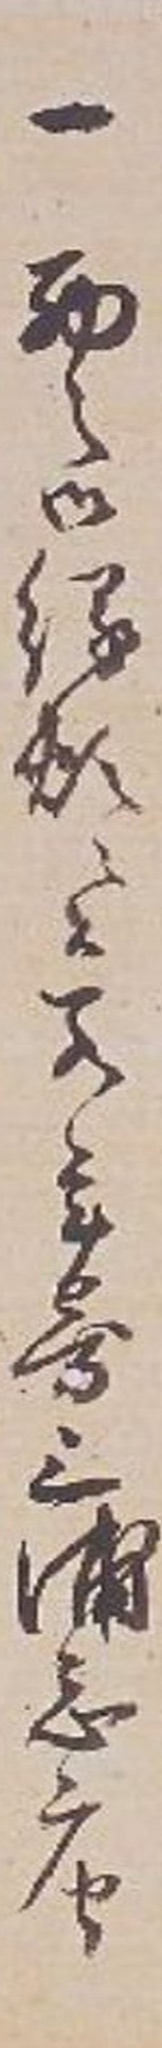一西之縁頬に而先年寄三浦志摩守
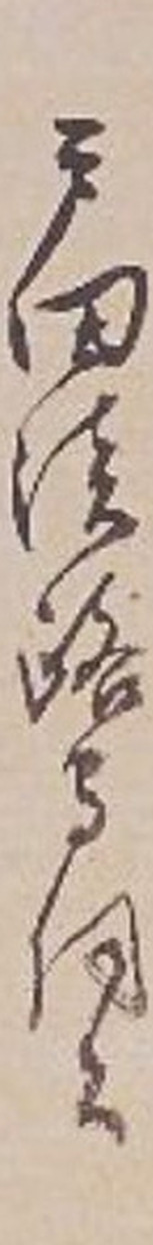戸田淡路守伺公
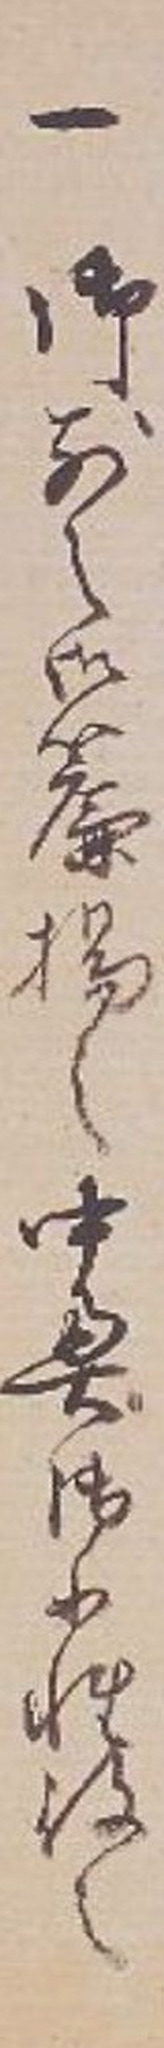一御前之御簾揚之中奥御小性役之
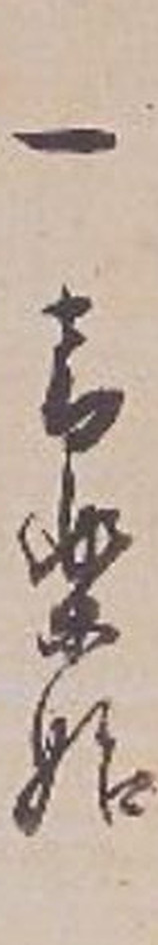一音楽始
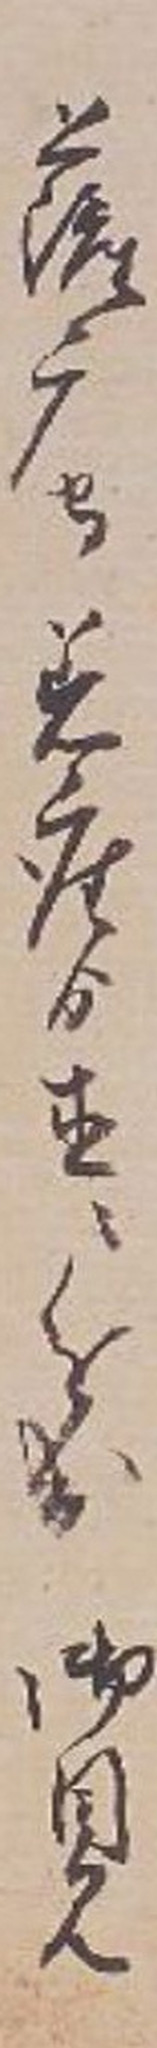薩摩守着座ゟ直に進出御目見

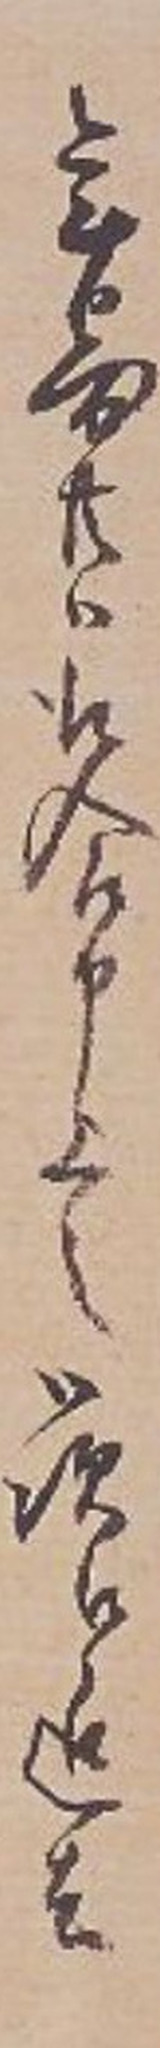年寄共御取入被申上之御次え退去
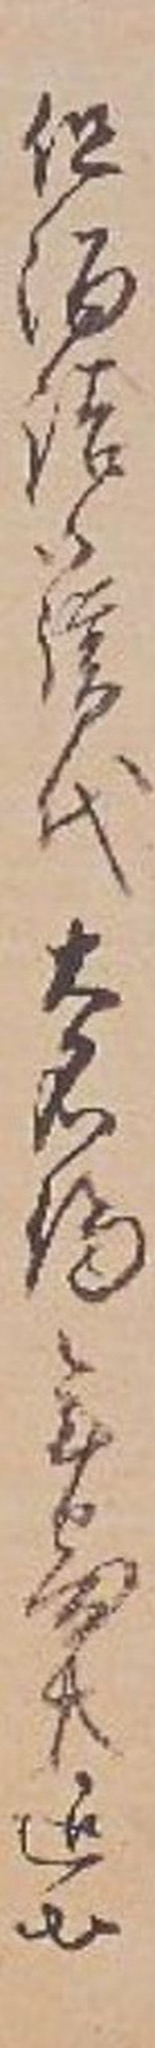但溜詰御譜代大名謁年寄共退出
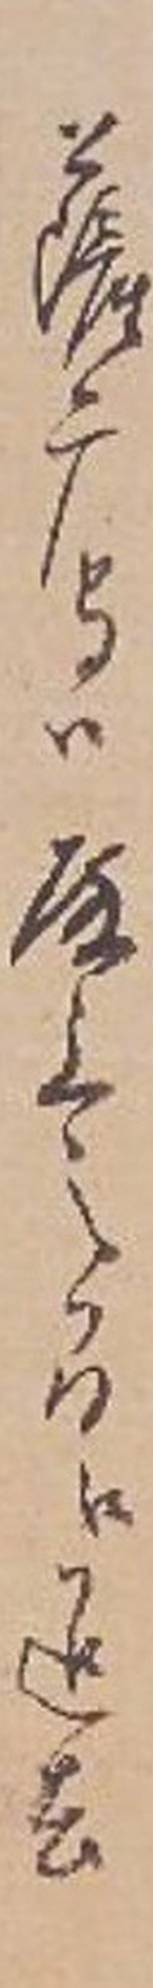薩摩守は殿上之間え退去
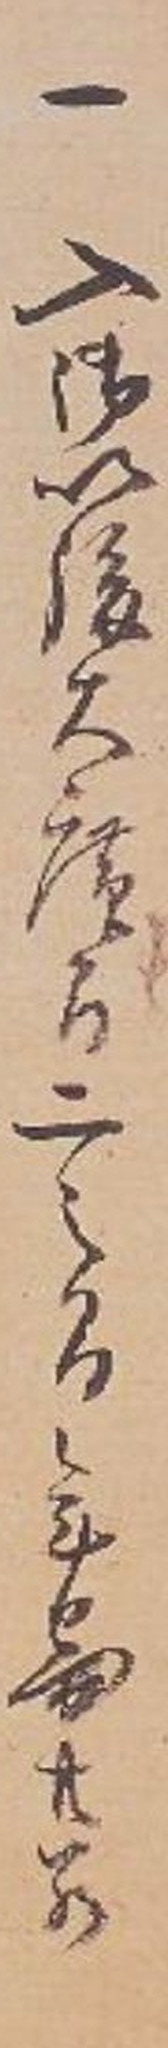一入御以後大広間二之間年寄共前
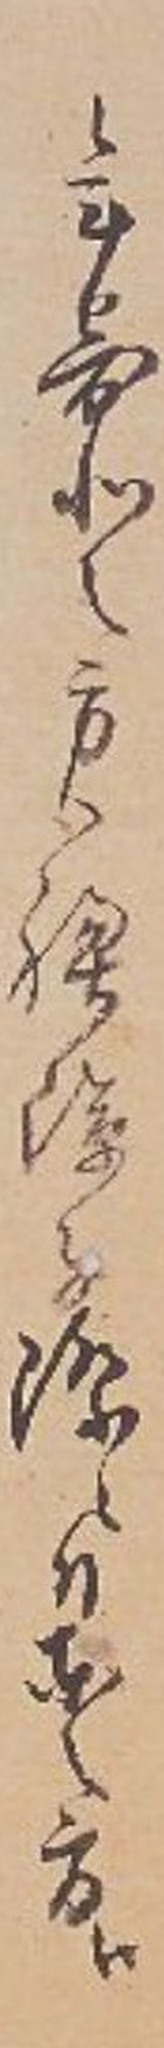年寄北之方御襖障子際に而東之方え
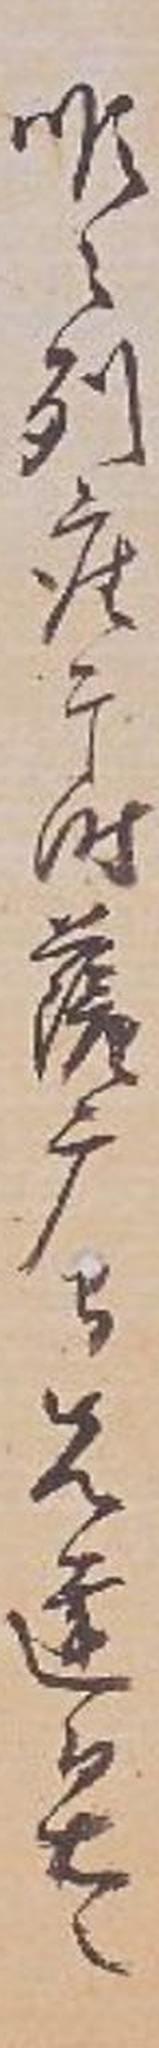順々列座于時薩摩守先達而右之
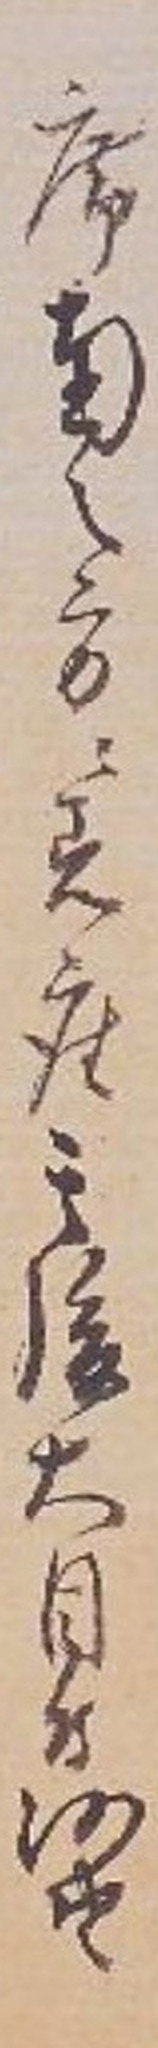席南之方に着座其後大目付河野
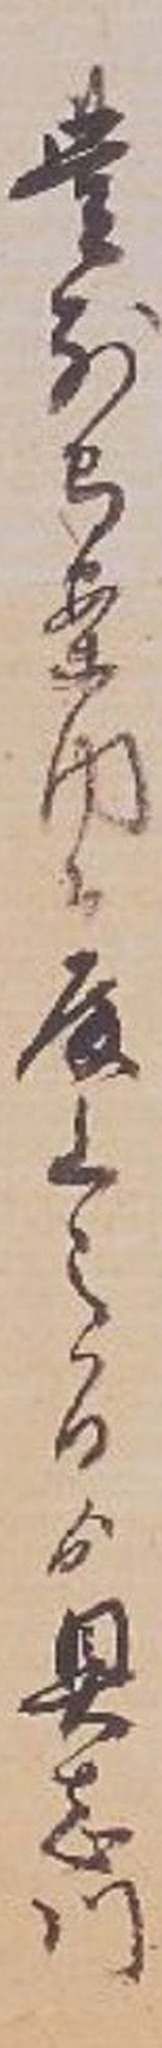豊前守案内而殿上之間ゟ具志川
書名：琉球人来朝記 八、九
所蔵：University of the Ryukyus Library
